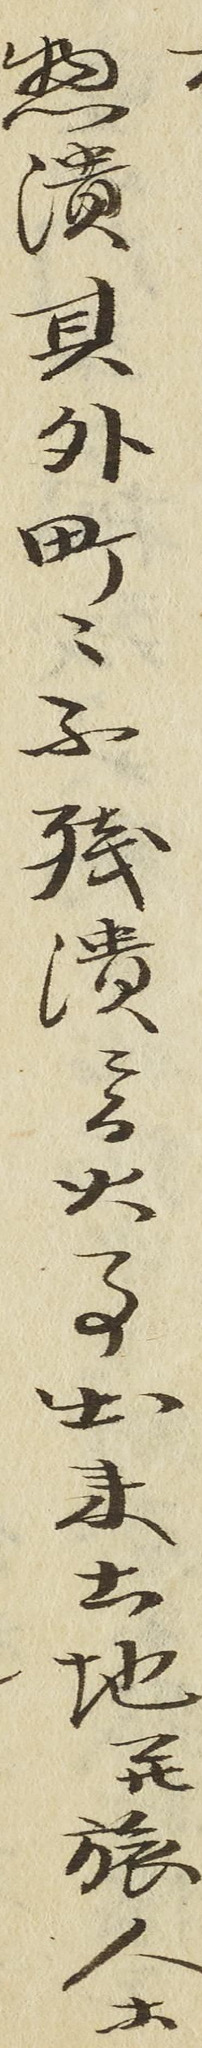惣潰其外町々不残潰二而火事出来土地并旅人等
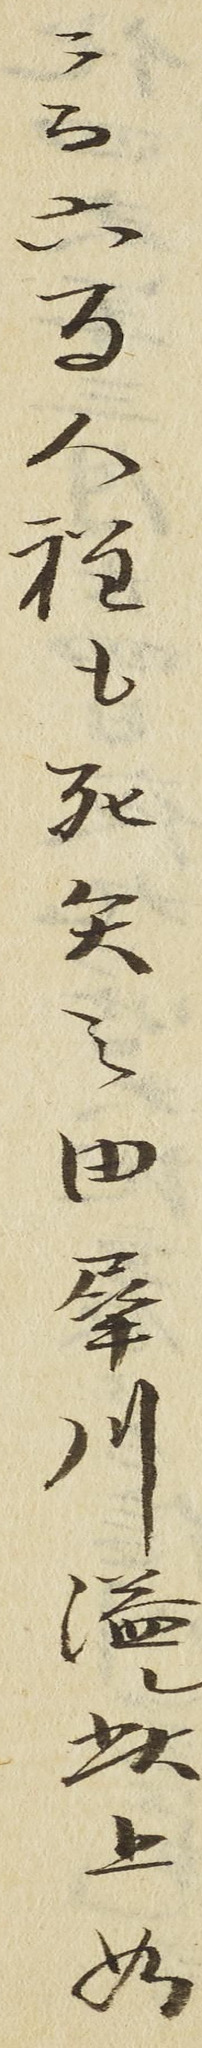二而六百人程も死矢之由犀川溢レ此上如
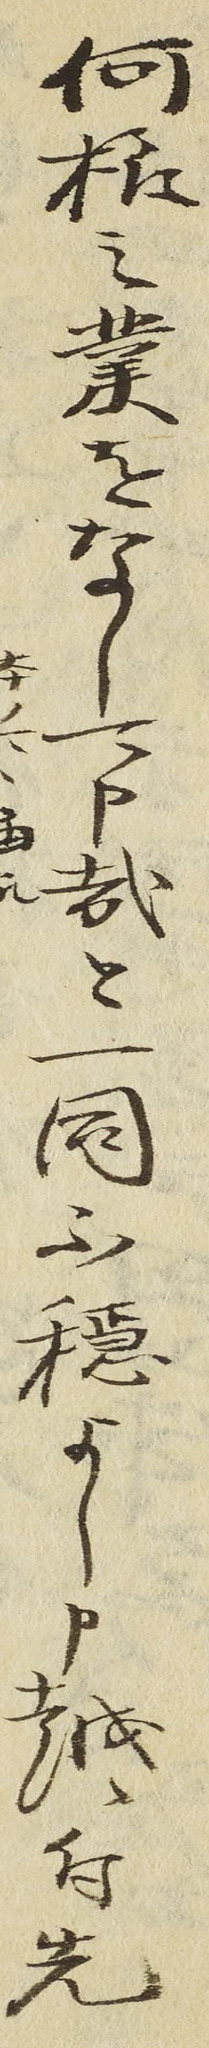何様之業をなし可申哉と一同不穏よし申越候付先
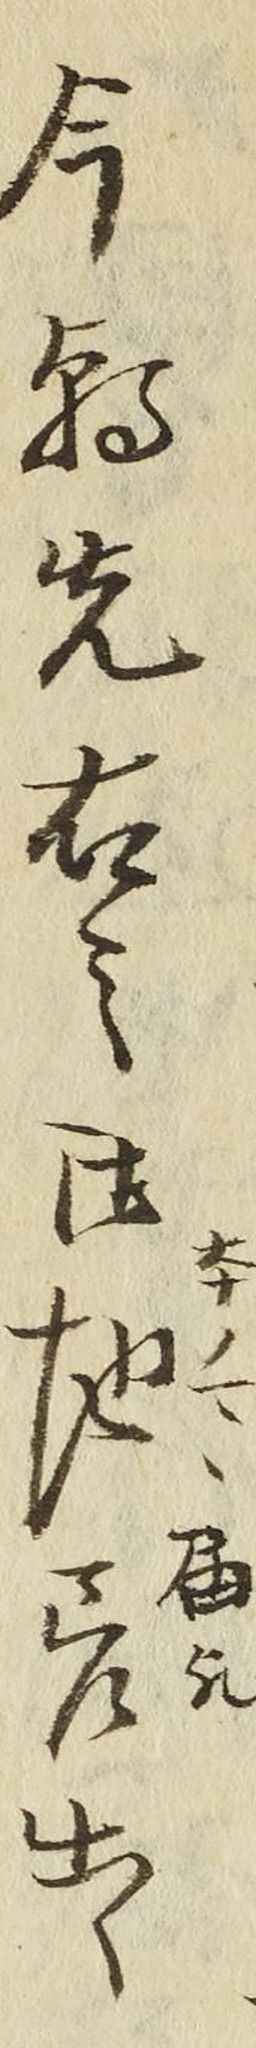今朝先右之御地差出候
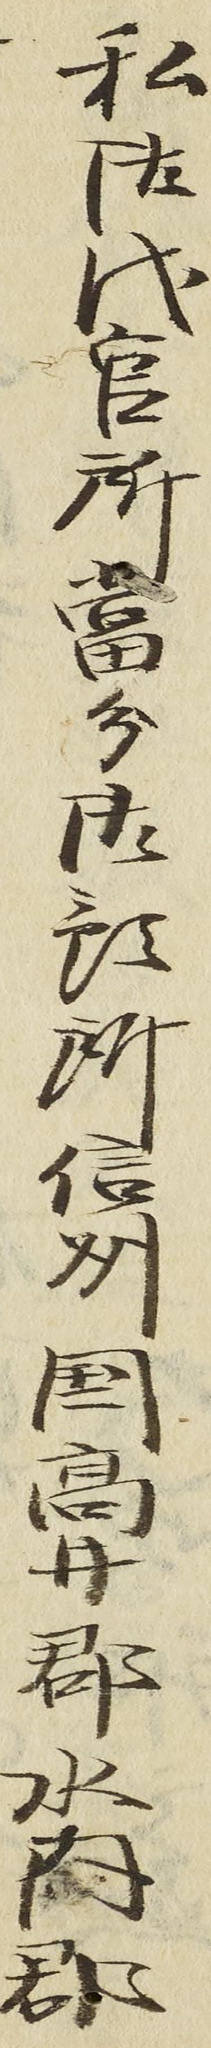私御代官所当分御預所信州国高井郡水内郡
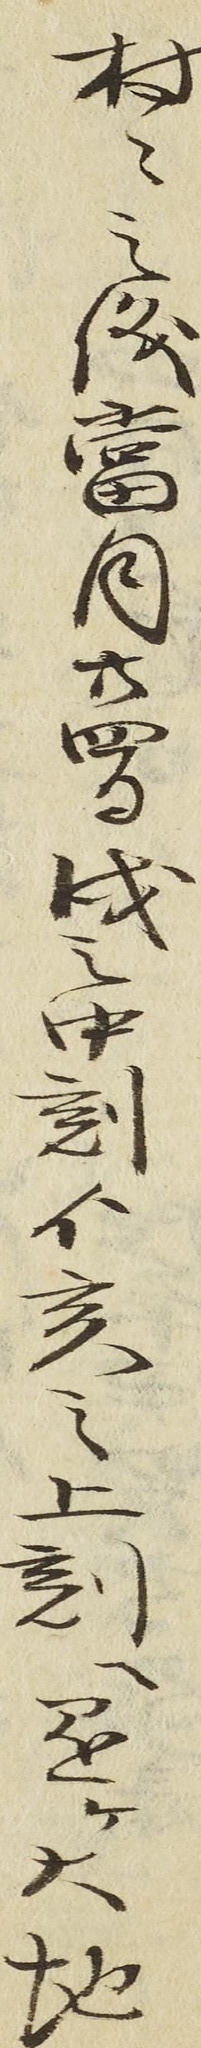村々之儀当月廿四日戌之中刻ゟ亥之上刻へ懸ヶ大地
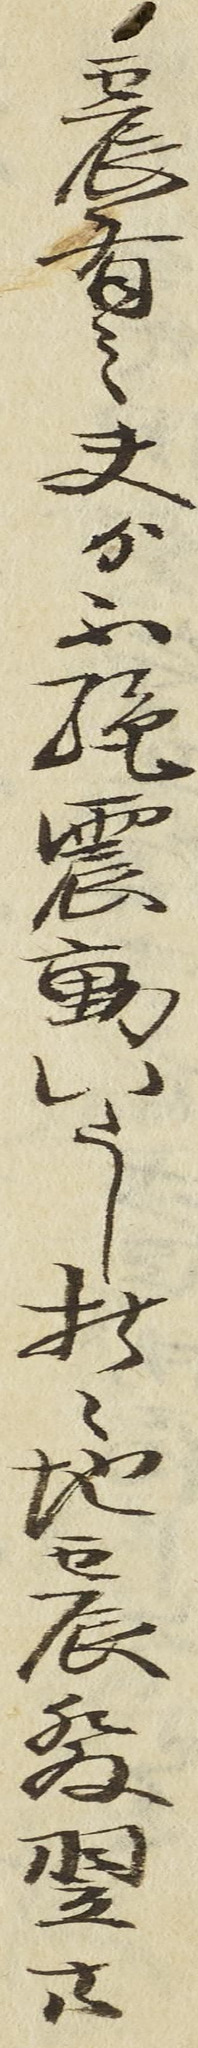震有之夫ゟ不絶震動いたし折々地震発翌廿
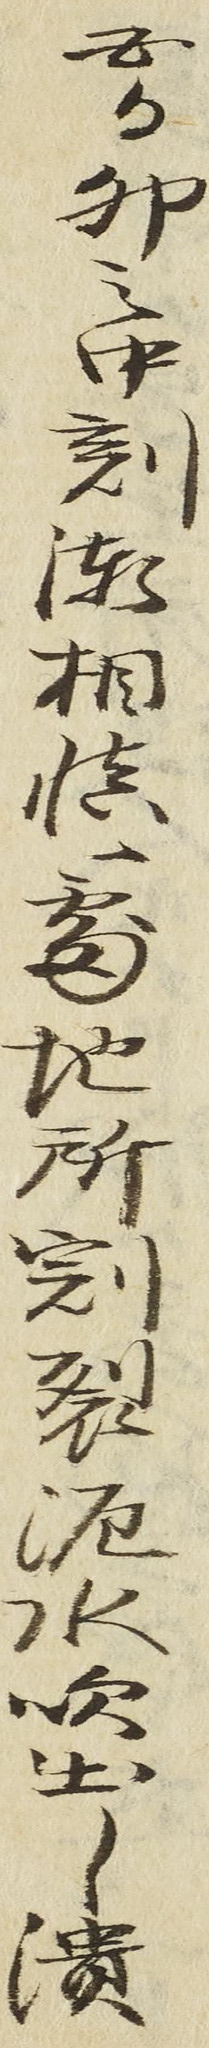五日卯之中刻漸相慎候処地所割裂泥水吹出し潰
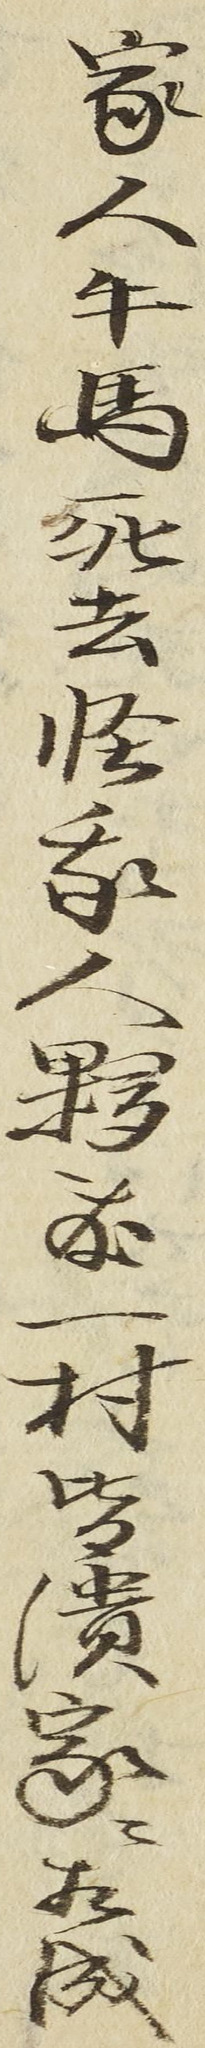家人牛馬死去怪我人夥敷一村皆潰家ニ相成
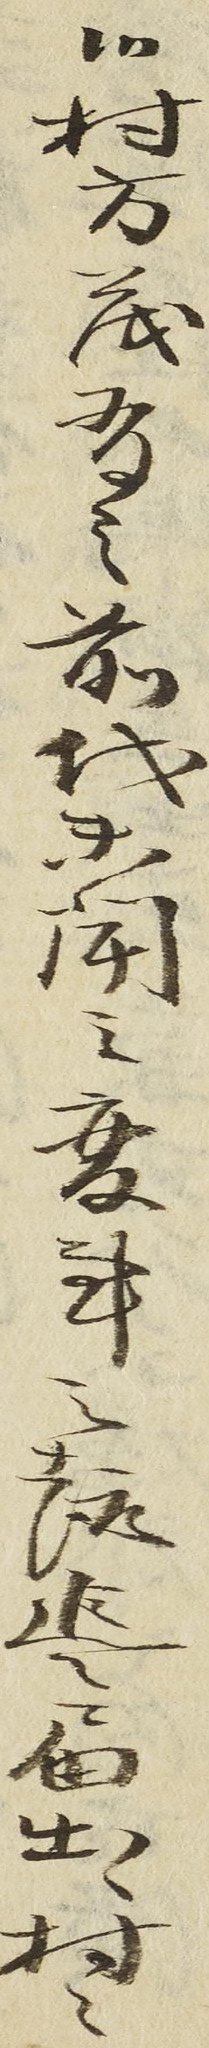候村方も有之前代未聞之変事之趣追々届出候村々
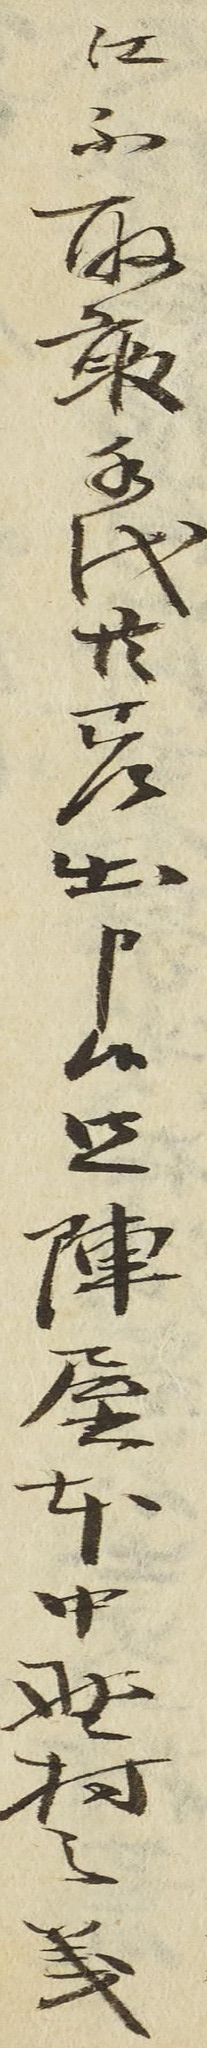江不取敢手代共差出申候且陣屋本中野村之義
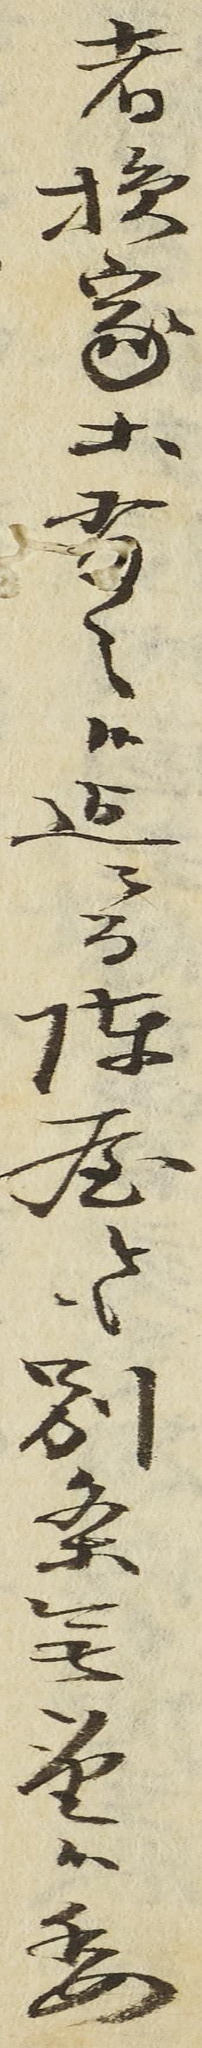は損家等有之候迄二而陣屋とも別条無御座候委
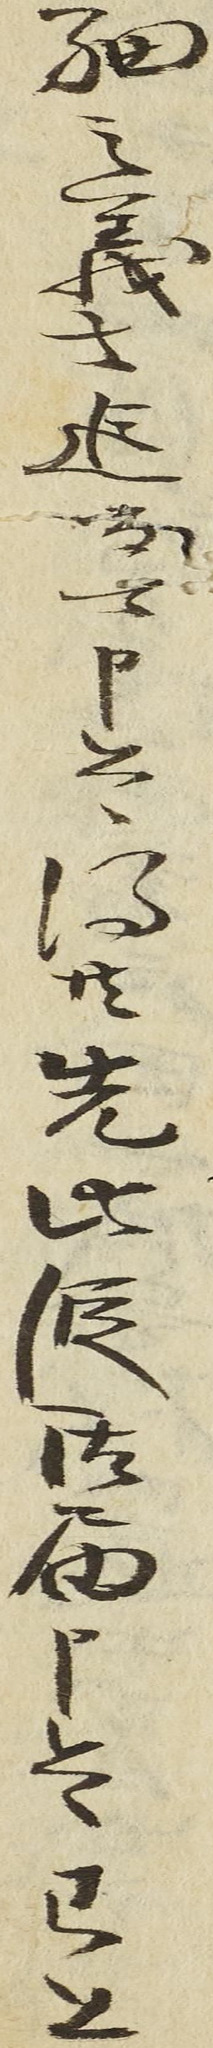細之義は追而可申上候得共先此段御届申上候已上
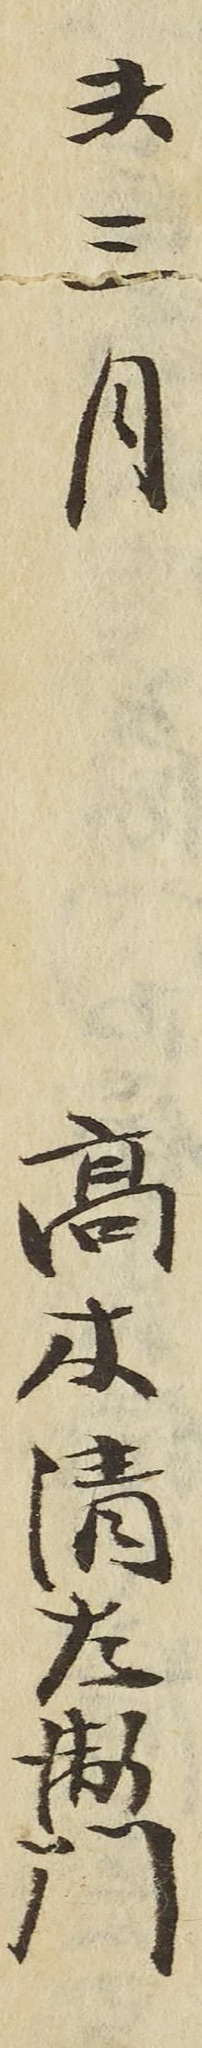未三月高木清左衛門

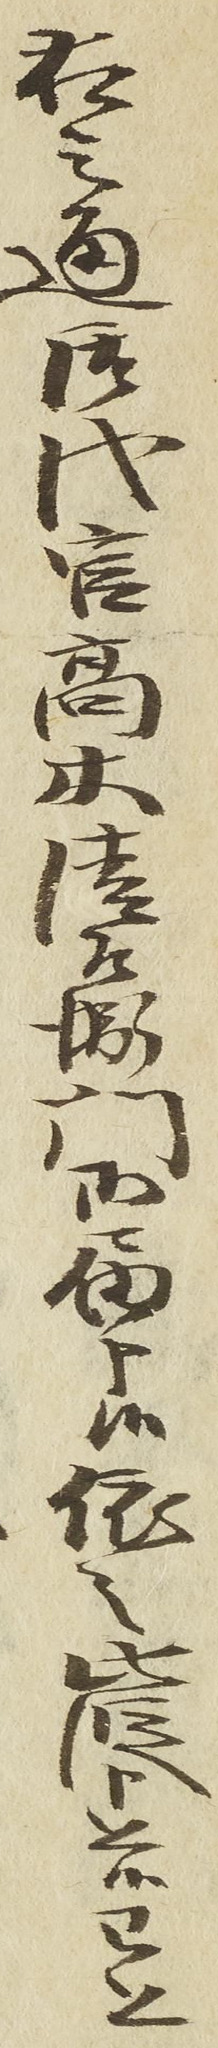右之通御代官高木清左衛門御届申候依之此段申上候已上
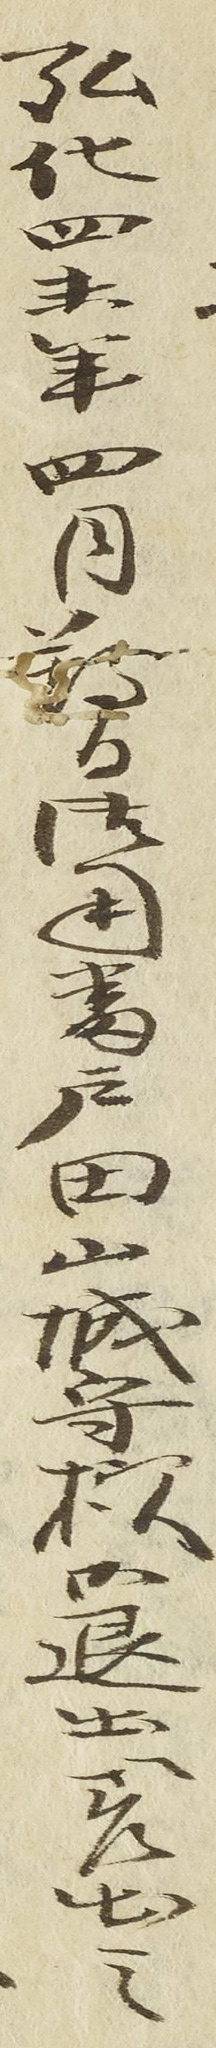弘化四未年四月朔日御用番戸田山城守様御退出へ差出之
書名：信濃國大地震記　乾
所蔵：東京大学地震研究所図書室 Earthquake Research Institute Library, The University of Tokyo, JAPAN
